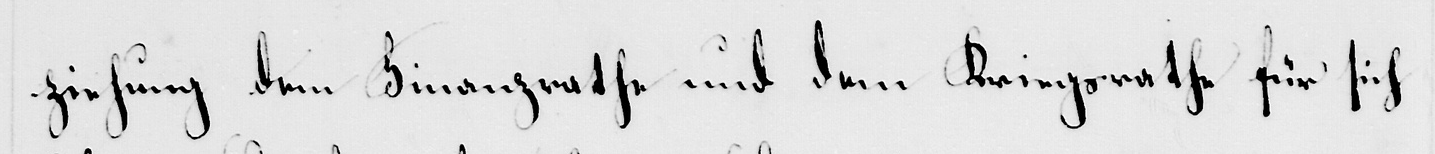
ziehung dem Finanzrathe und dem Kriegsrathe für sich
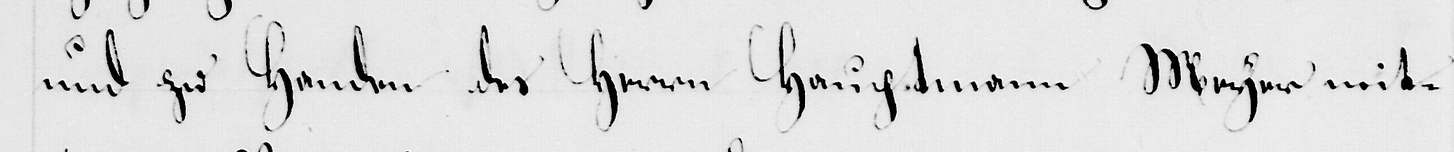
und zu Handen des Herrn Hauptmann Meyer mit¬
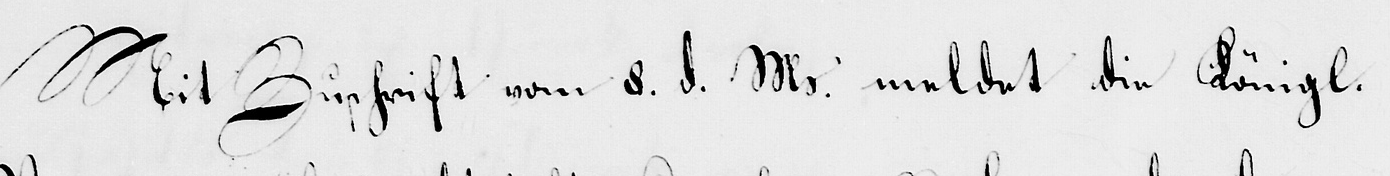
Mit Zuschrift vom 8. d. Ms. meldet die Königl.
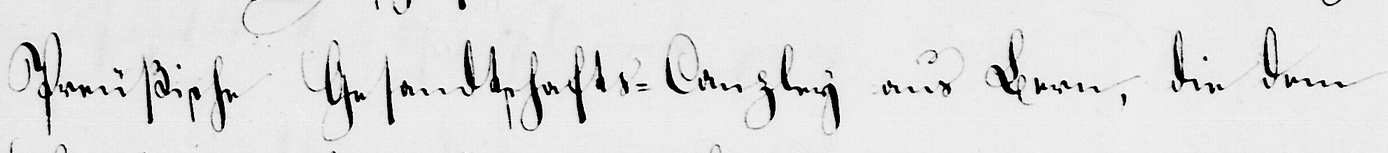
Preußische Gesandtschafts-Canzley aus Bern, die dem
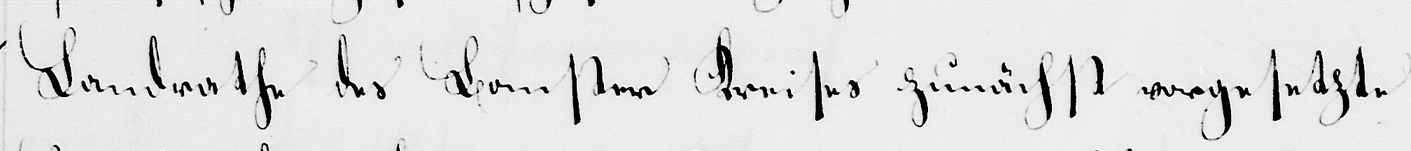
Landrathe des Bomster Kreises zunächst vorgesetzte
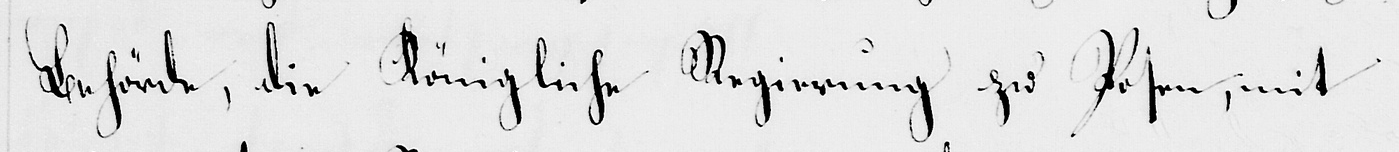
Behörde, die Königliche Regierung zu Posen, mit
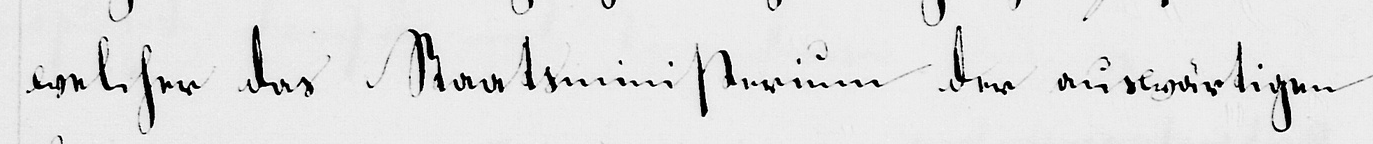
welcher das Staatsministerium der auswärtigen
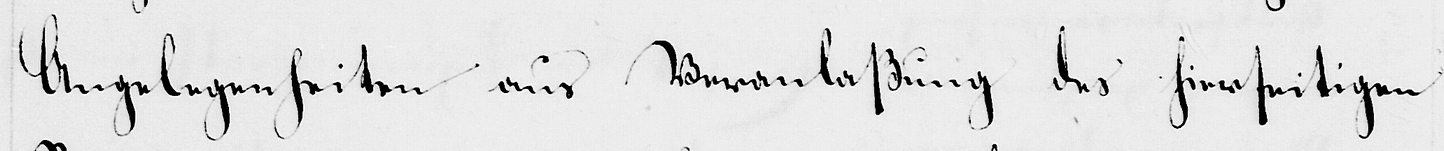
Angelegenheiten aus Veranlaßung des hierseitigen
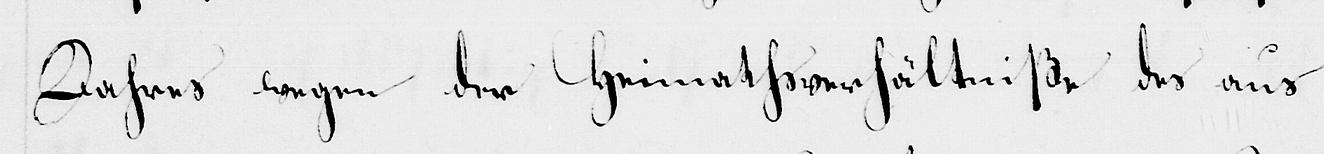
Jahres wegen der Heimathsverhältniße des aus
